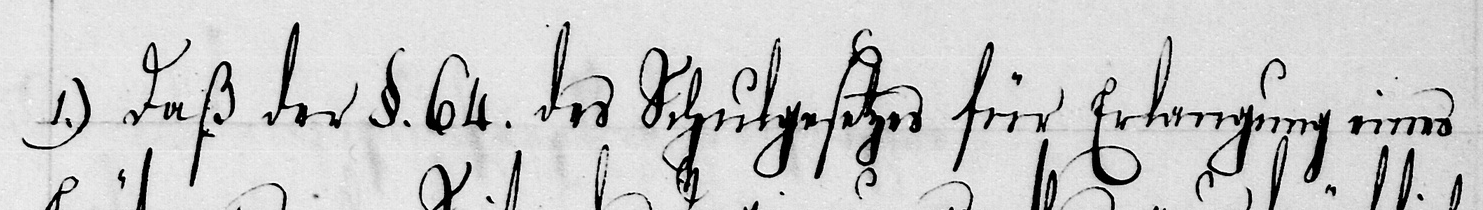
1.) Daß der §. 64. des Schulgesetzes für Erlangung eines
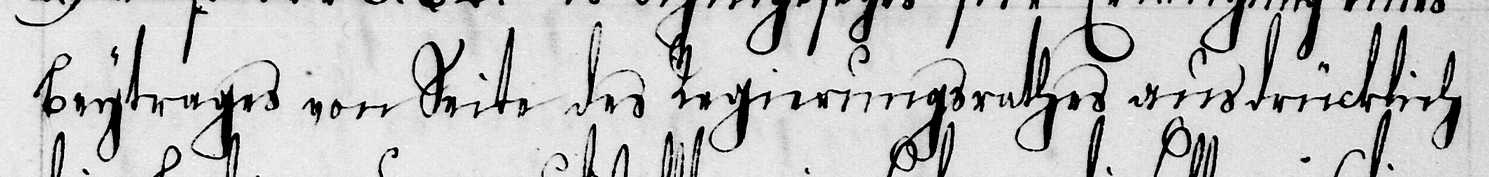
Beytrages von Seite des Regierungsrathes ausdrücklich
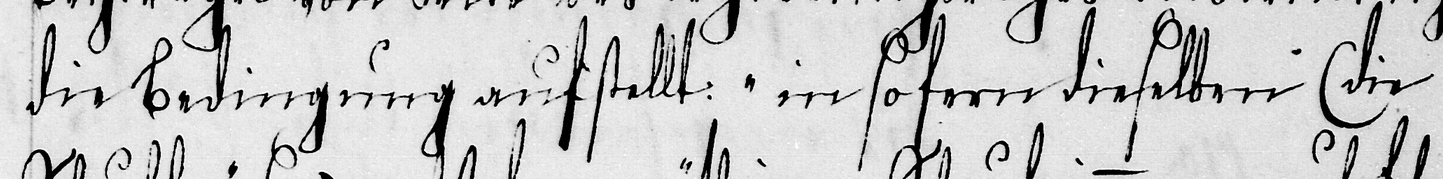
die Bedingung aufstellt: „in so fern dieselben (die
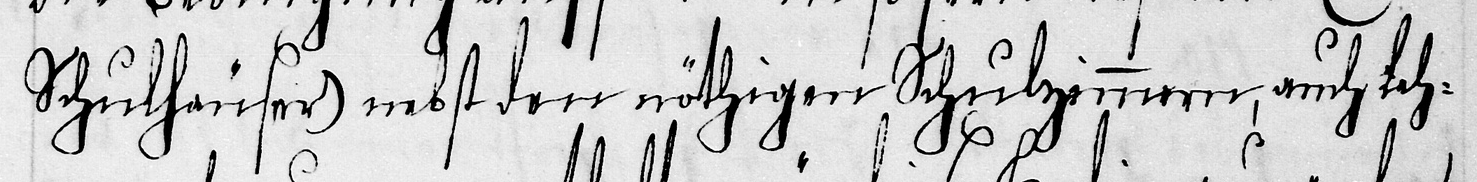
Schulhäuser) nebst den nöthigen Schulzimmern, auch Leh¬
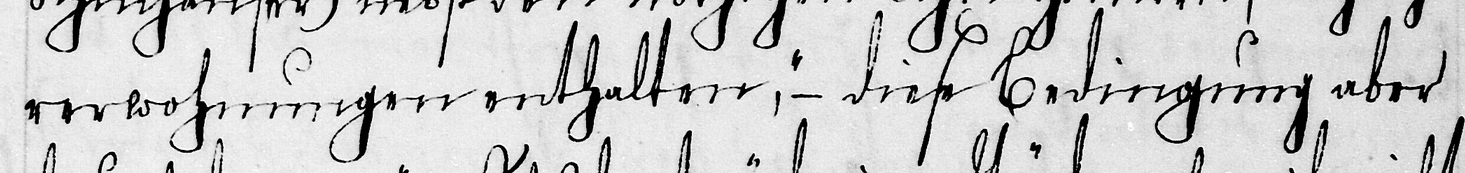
rerwohnungen enthalten,“ – diese Bedingung aber
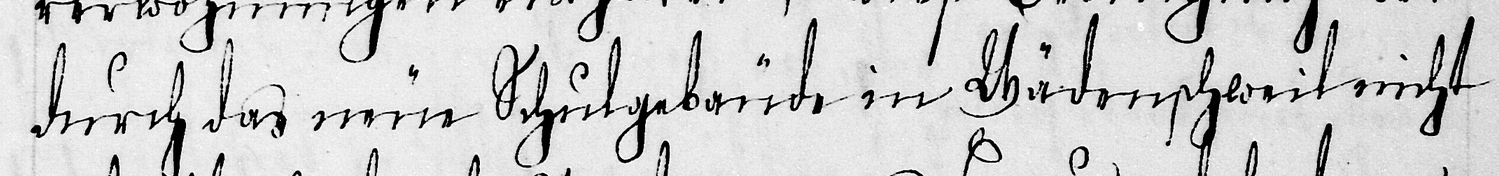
durch das neue Schulgebäude in Wädenschweil nicht
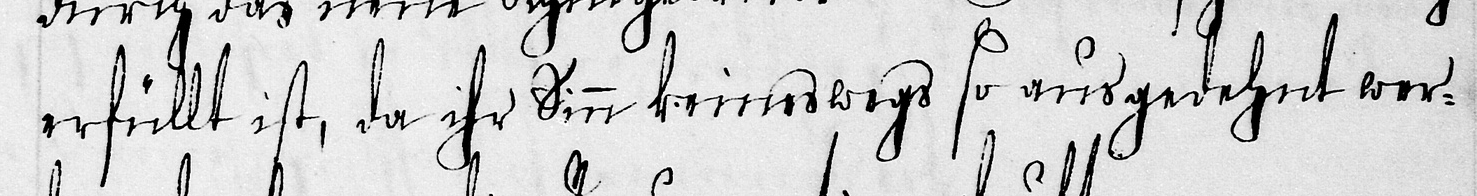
erfüllt ist, da ihr Sinn keineswegs so ausgedehnt wer¬
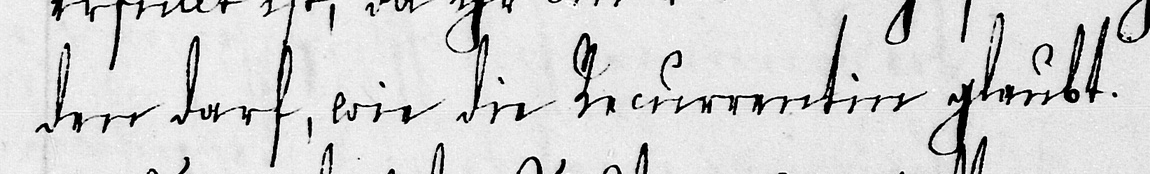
den darf, wie die Recurrentin glaubt.
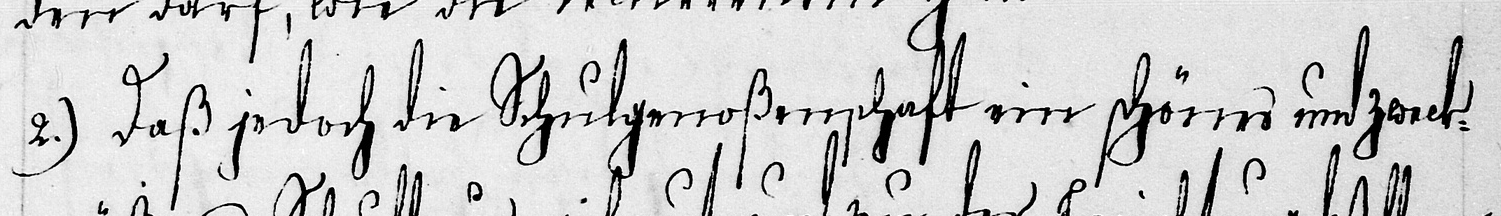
2.) Daß jedoch die Schulgenoßenschaft ein schönes und zwec¬
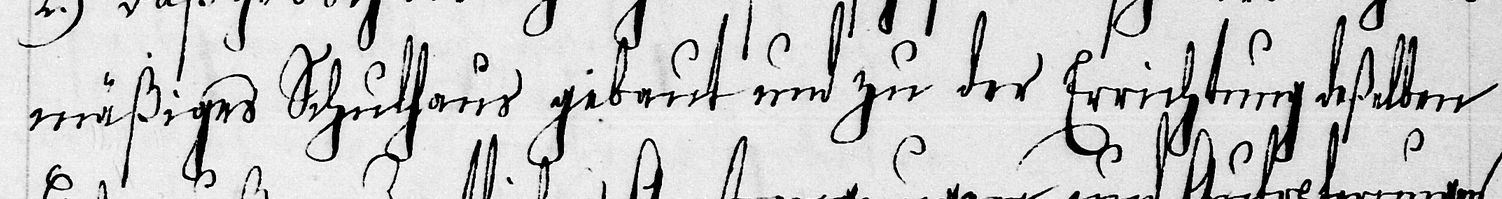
kmäßiges Schulhaus gebaut und zu der Errichtung deßelben
